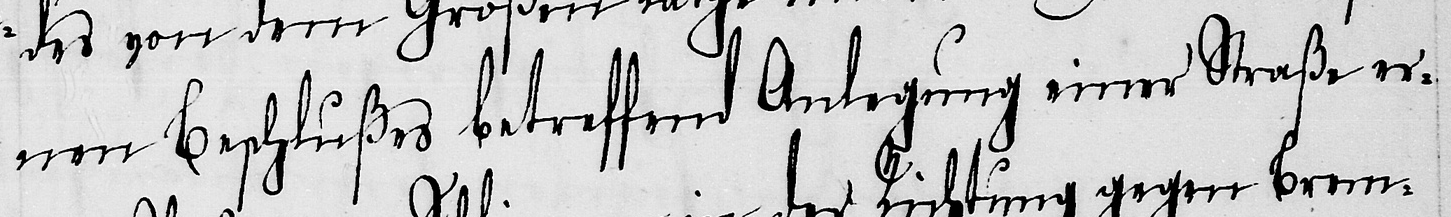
nen Beschlußes betreffend Anlegung einer Straße ers¬
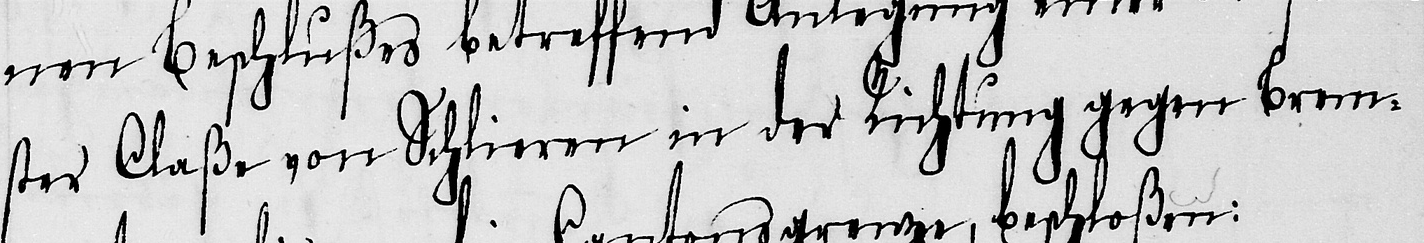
ter Claße von Schlieren in der Richtung gegen Brem¬
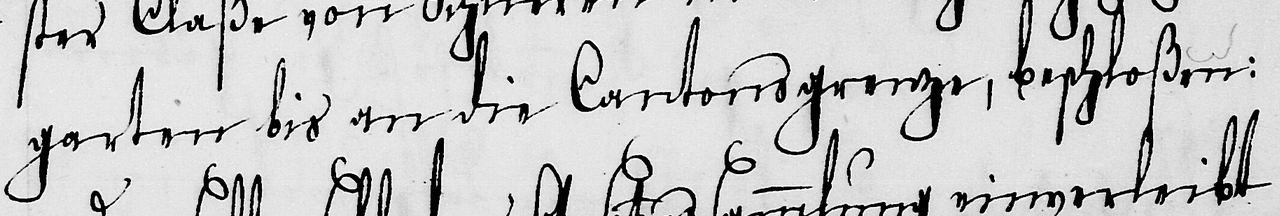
garten bis an die Cantonsgrenze, beschloßen:
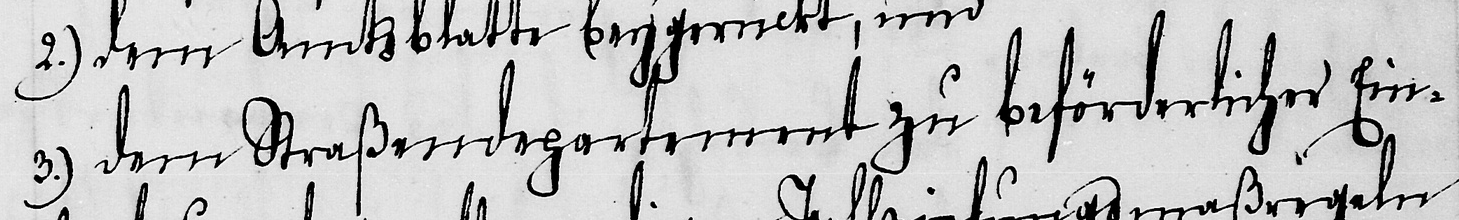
3.) dem Straßendepartement zu beförderlicher Ein¬
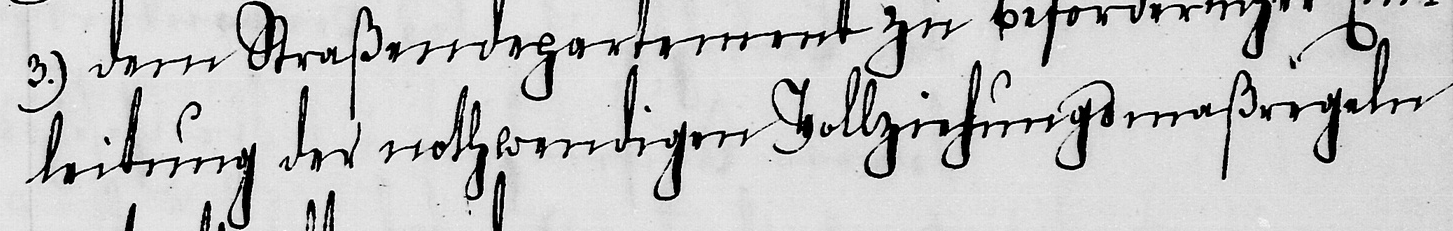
leitung der nothwendigen Vollziehungsmaßregeln
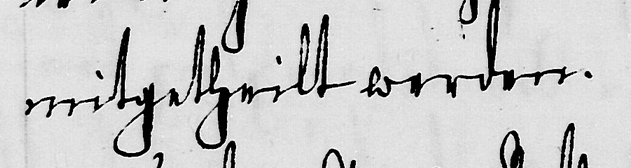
mitgetheilt werden.
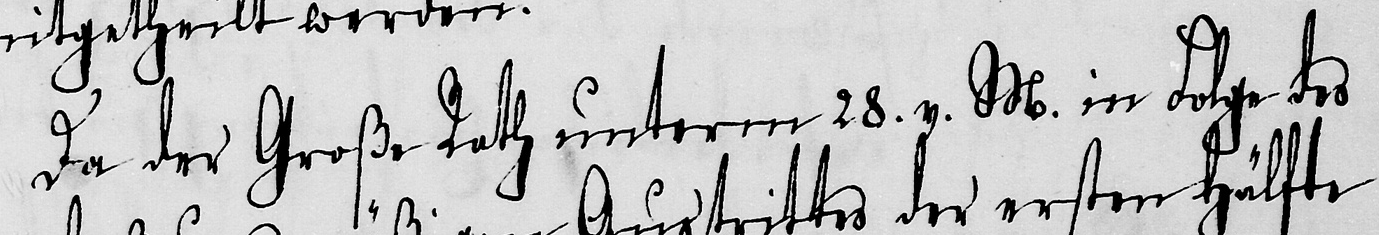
Da der Große Rath unterm 28. v. M. in Folge des
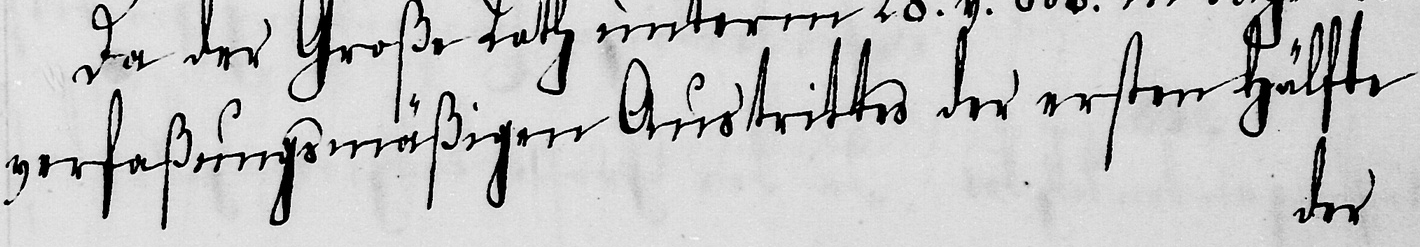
verfaßungsmäßigen Austrittes der ersten Hälfte
